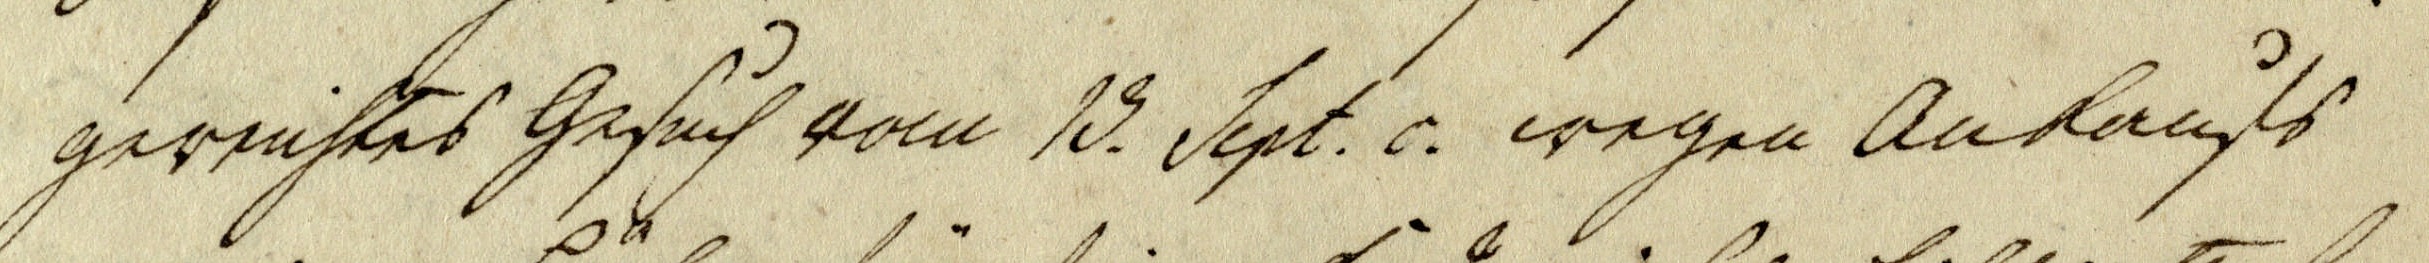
gereichtes Gesuch vom 13. Sept. c. wegen Ankaufs
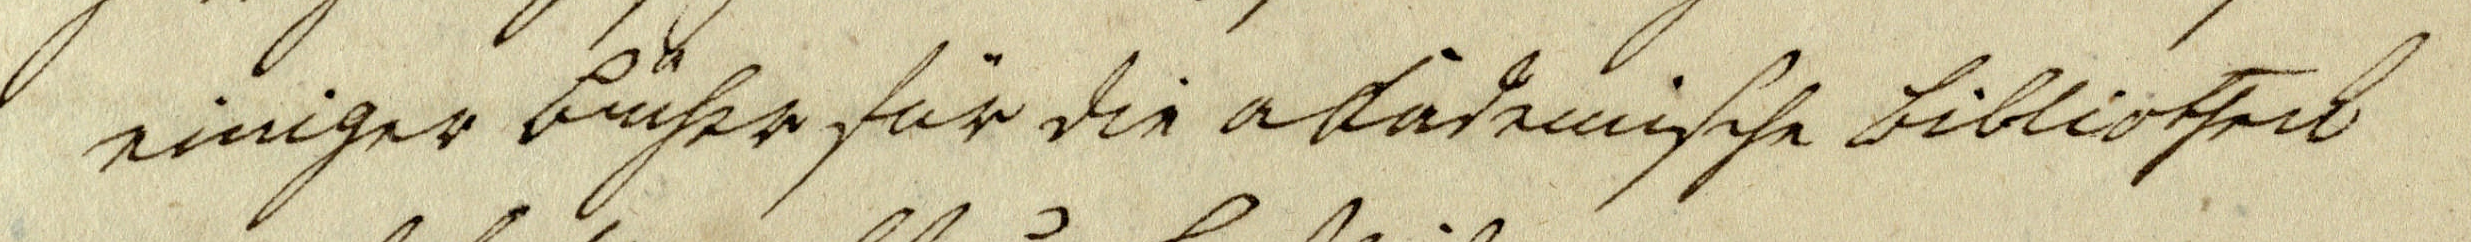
einiger Bücher für die akademische Bibliotheck
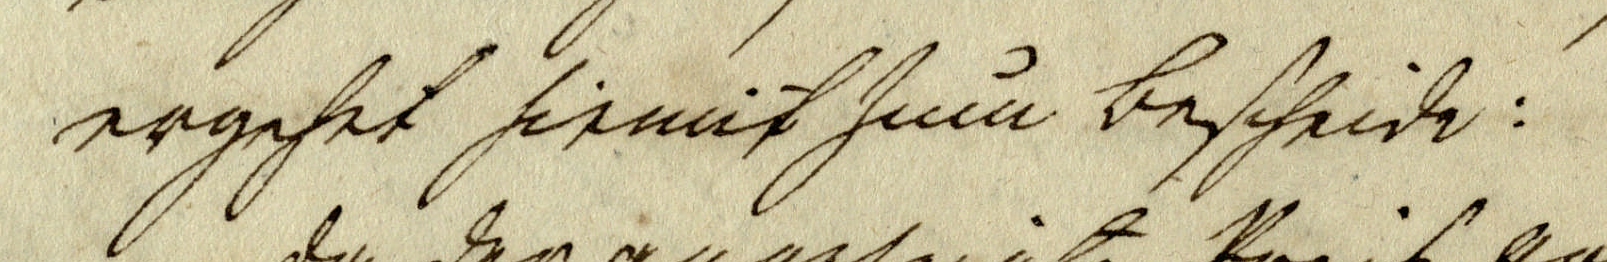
ergehet hiemit zum Bescheide:
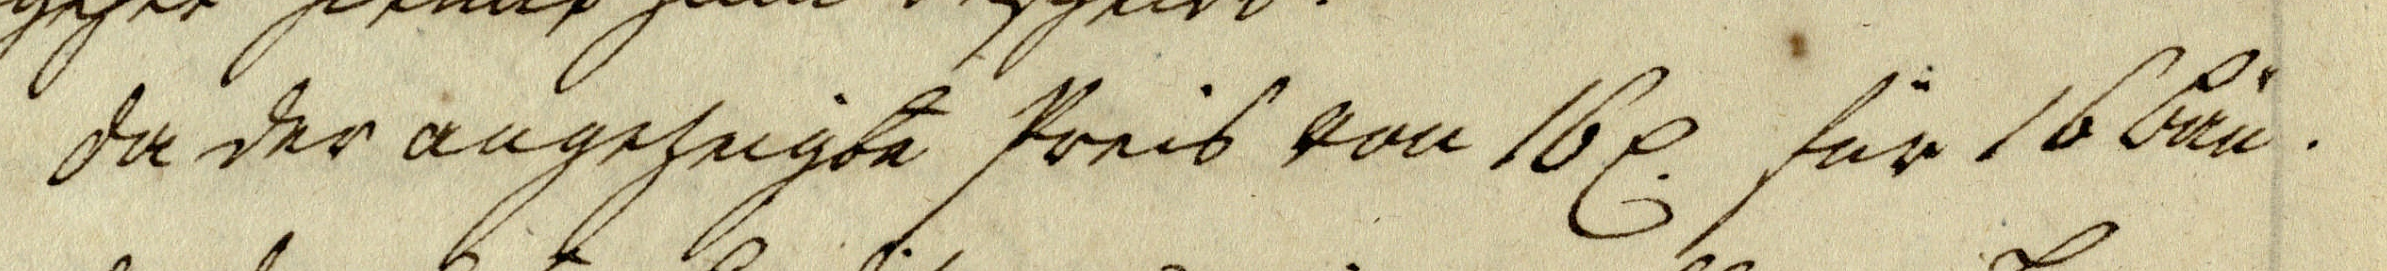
da der angezeigte Preis von 16 l. für 16 Bän¬
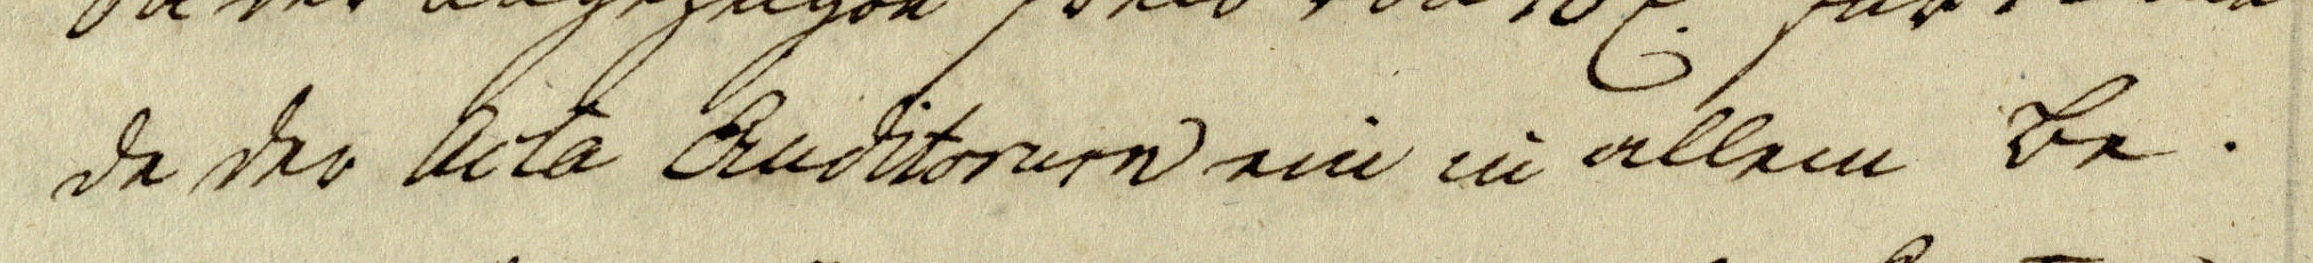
de der Acta Eruditorum ein in allem Be¬
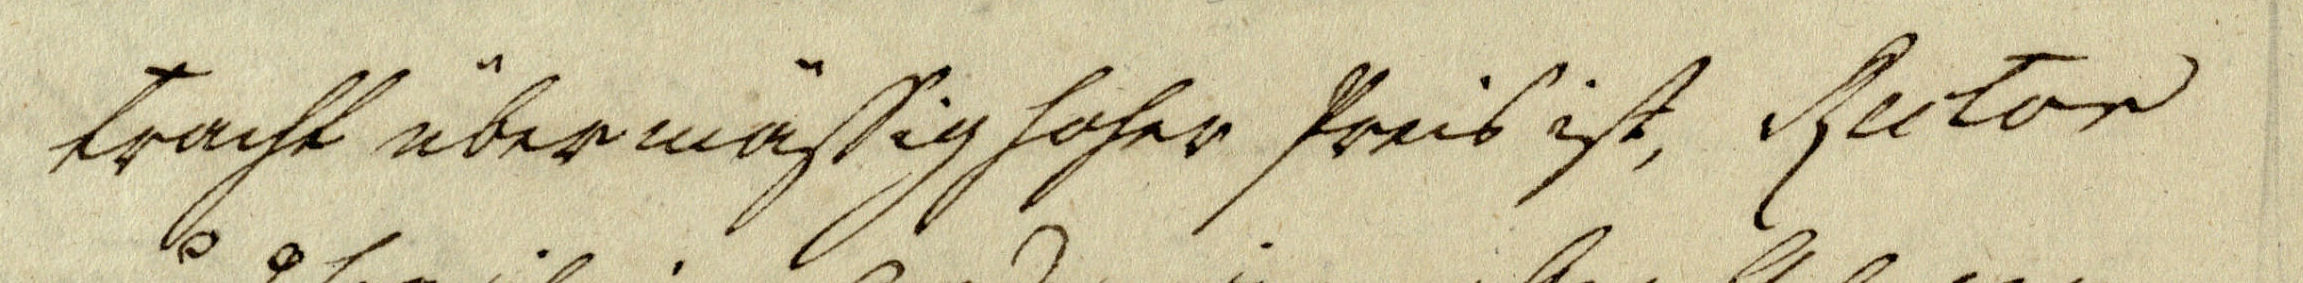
tracht übermässig hoher Preis ist, Rector
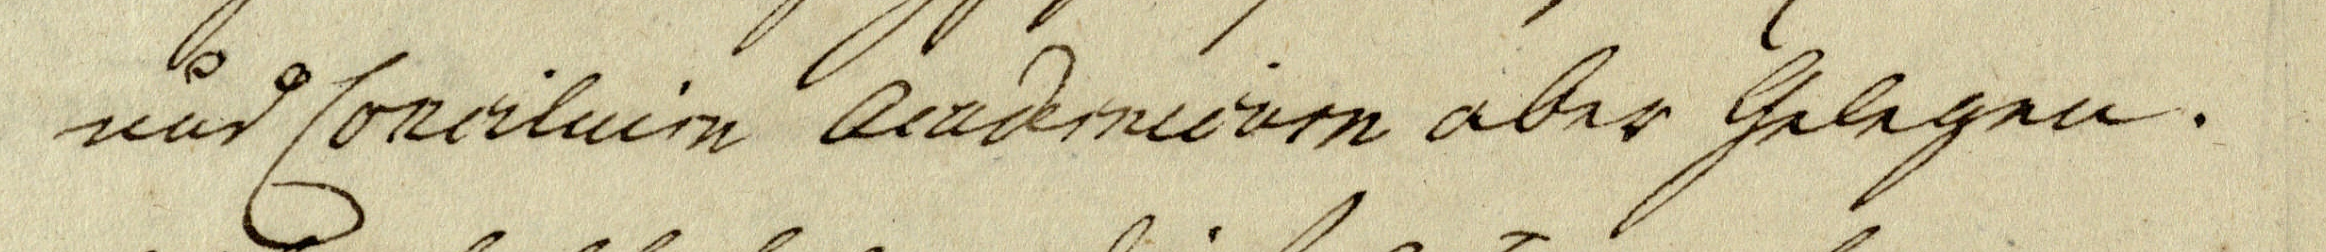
und Concilium Academicum aber Gelegen¬
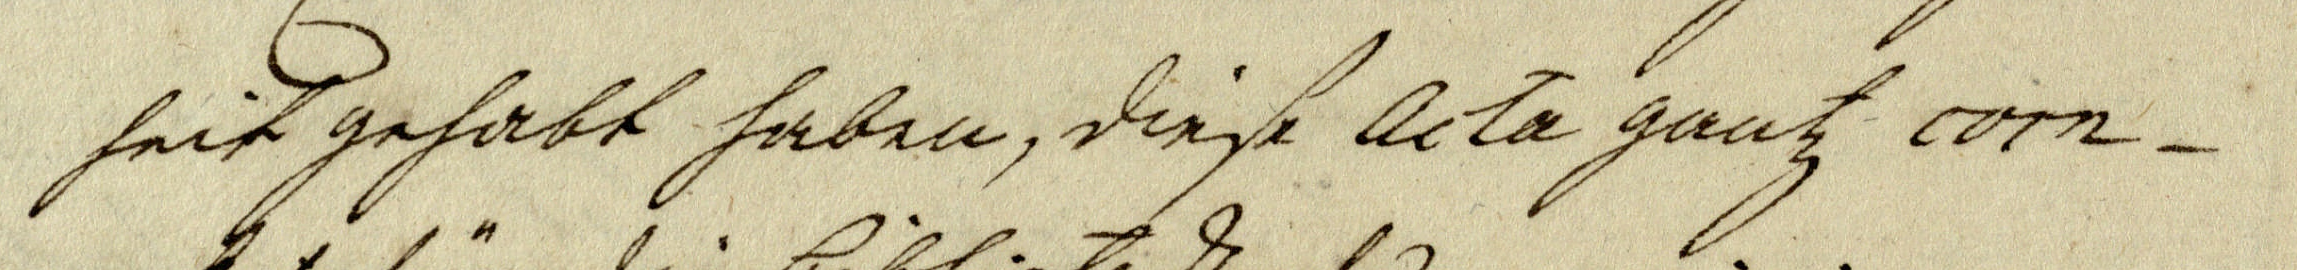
heit gehabt haben, diese Acta gantz com¬
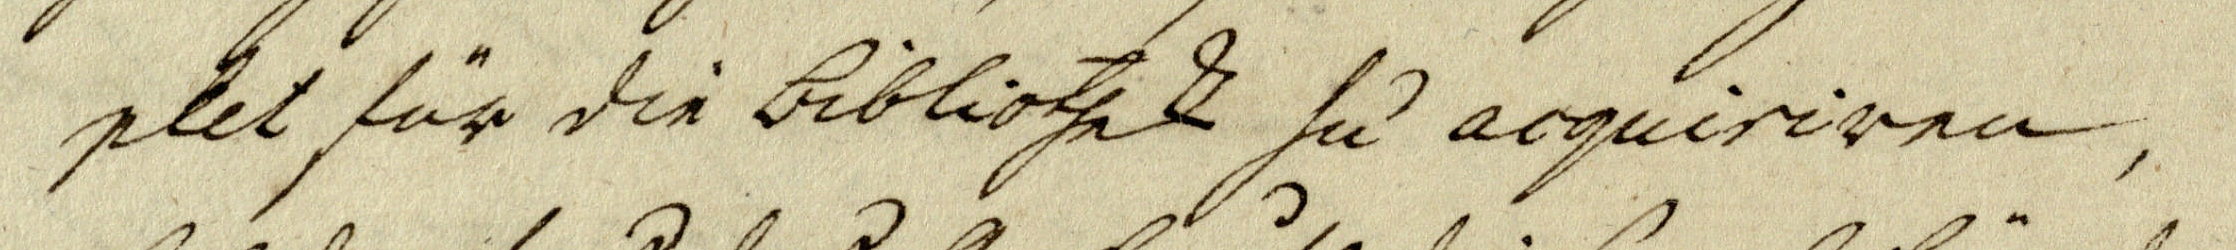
plet für die Bibliothek zu acquiriren,
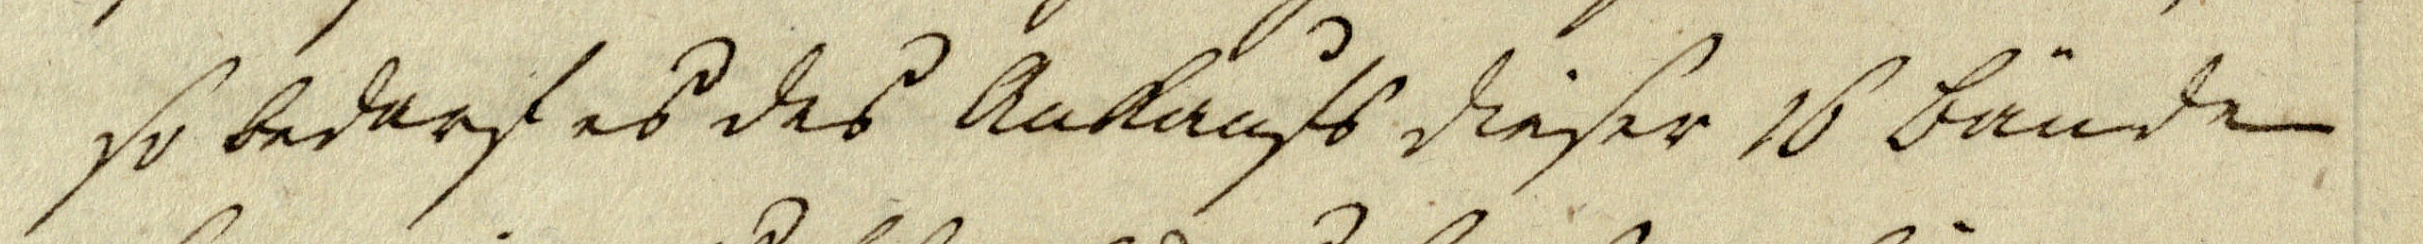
so bedarf es des Ankaufs dieser 16 Bände
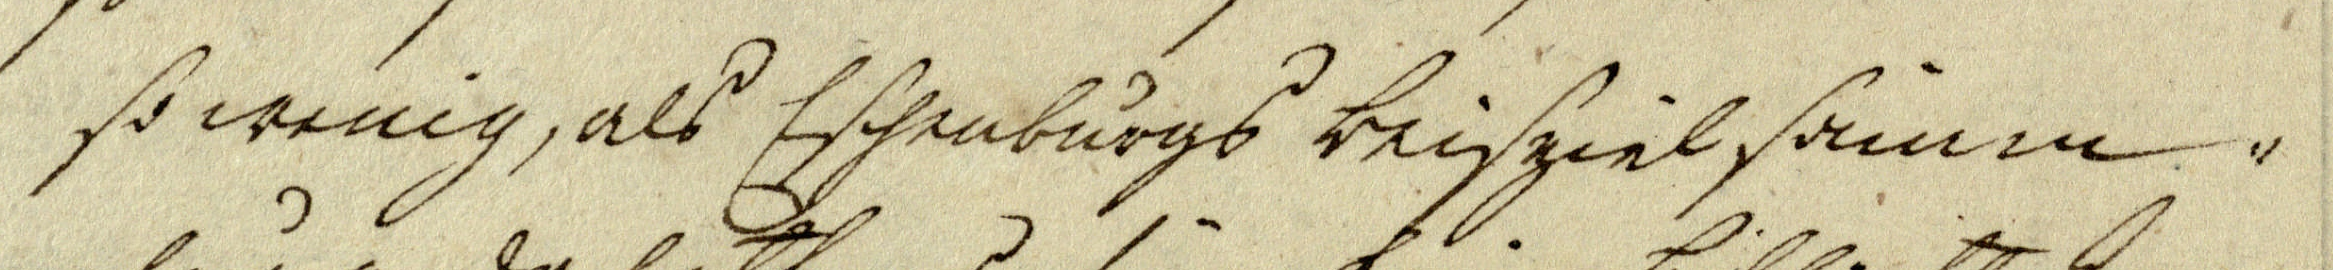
so wenig, als Eschenburgs Beispielsamm¬
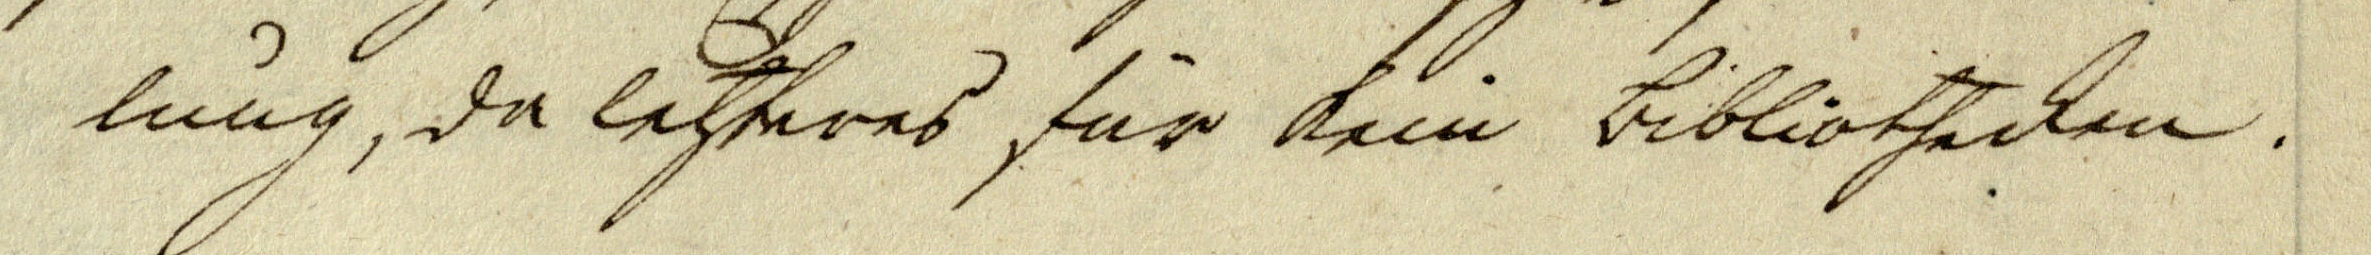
lung, da lezteres für kein Bibliothecken
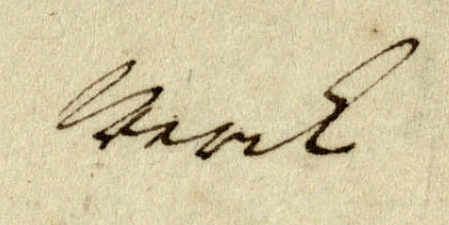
Werck
